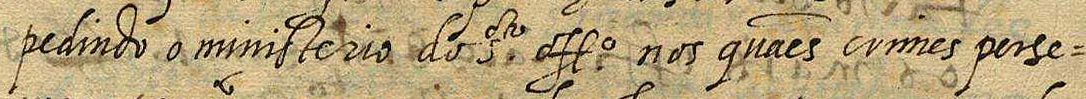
pedindo o ministerio do scto. off.o nos qūaes crimes perse
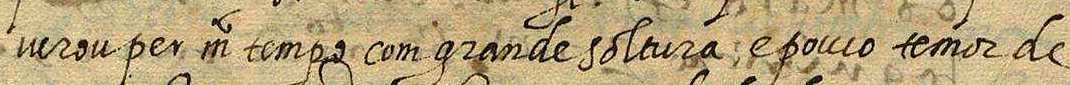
uerou per mto tempo com grande soltura, e pouco temor de
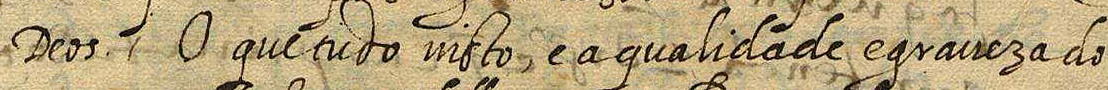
Deos. / O que tudo uisto, e a qualidade e graueza do
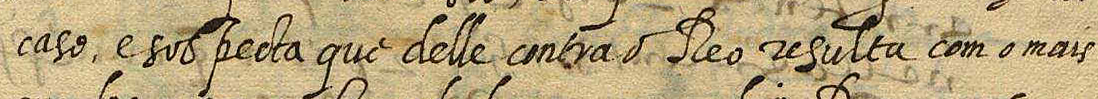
caso, e sospecta que delle contra o Reo resulta com o mais
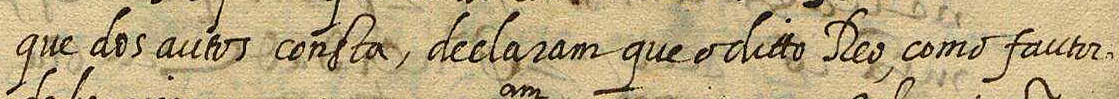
que dos autos consta, declaram que o ditto Reo, como fautor
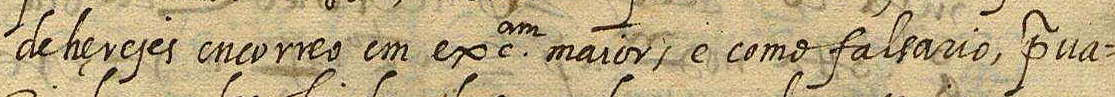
de herejes encorreo em exc.am maior, e como falsario, p̄ua
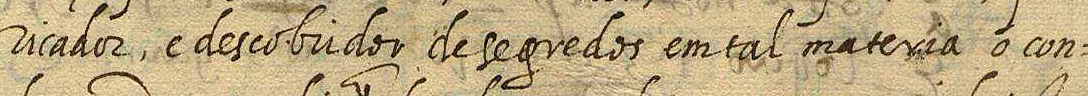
ricador, e descobridor de segredos em tal materia o con
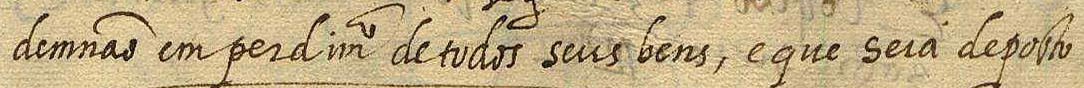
demnão em perdimto de todos seus bens, e que seia deposto
